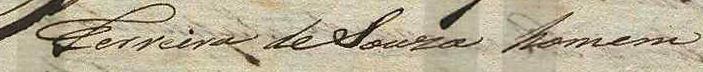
Ferreira de Souza homem
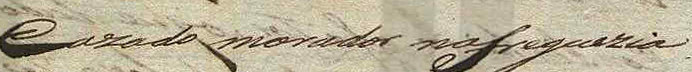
Cazado morador na freguezia
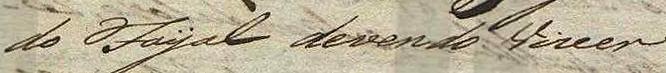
do Fayal devendo Viuer
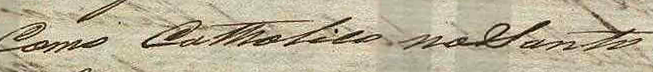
Como Catholico no Santo
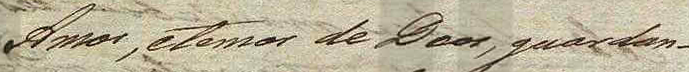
Amor, e temor de Deos, guardan
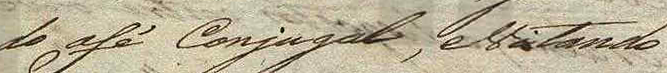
do a fé Conjugal, eVitando
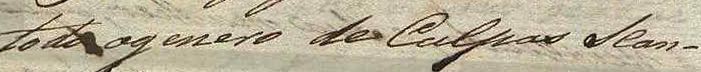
todo o genero de Culpas Scan
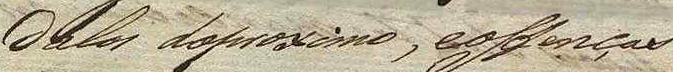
dalos do proximo, e offenças
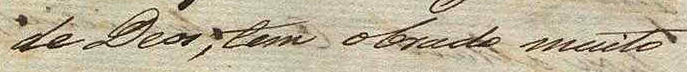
de Deos, tem obrado muito
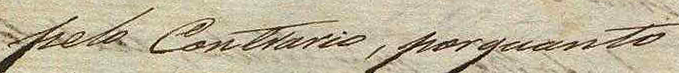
pelo Contrario, porquanto
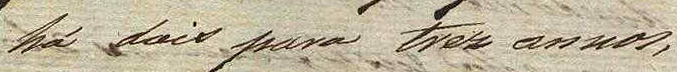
há dois para trez annos,
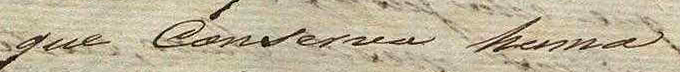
que Conserva huma
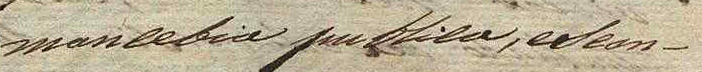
mancebia publica, e Sem
